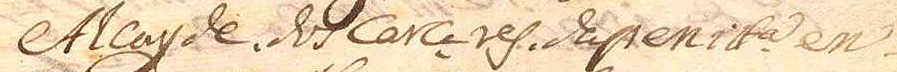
Alcayde dos Carceres da penitt.a en
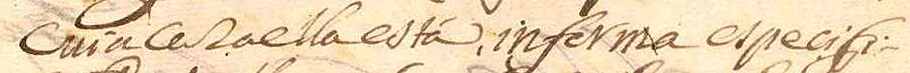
Cuia caza ella está, inferma especifi
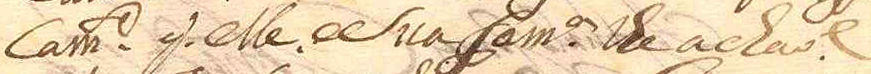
Cam.te q̄ elle, e sua fam.a lhe achaõ
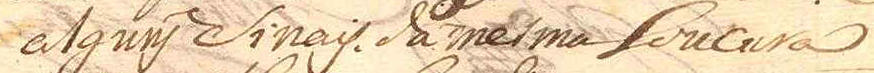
alguns sinais da mesma Loucura
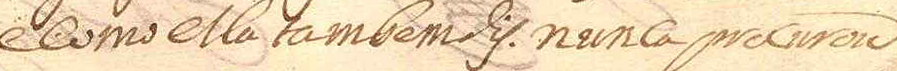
e como ella tambem dis. nunca procurou
